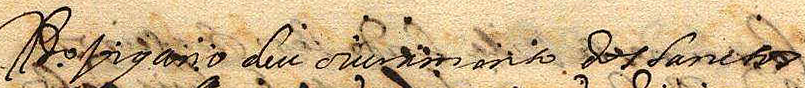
Rd.o Vigario deu o iuramento dos Sanctos
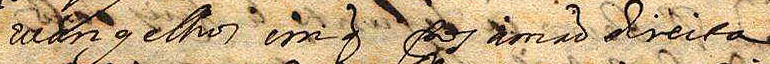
Euangelhos em q̄ pos a mão direita
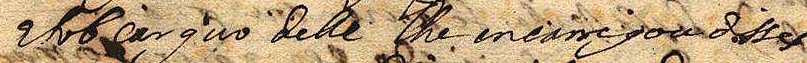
E sob carguo delle lhe encarregou disses
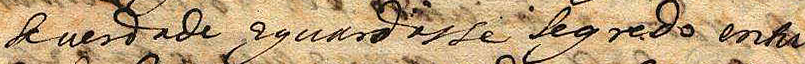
se uerdade E guardasse segredo en tu
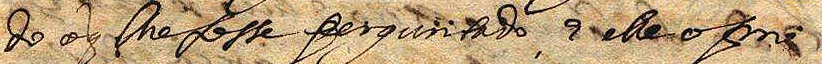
do o q̄ lhe fosse perguntado, E elle o pro
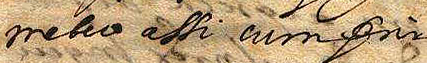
meteo assi cumprir
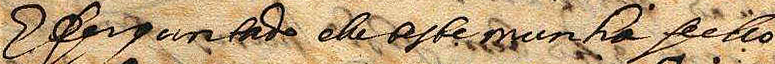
E perguntado elle testemunha pello
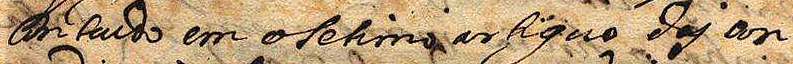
conteudo em o setimo artiguo das con
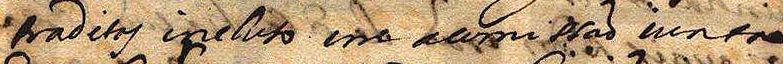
traditas incluso em a comissão iunta
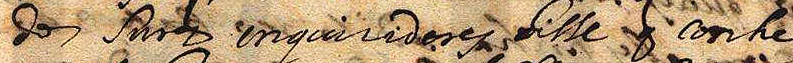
dos Snrēs inquizidores disse q̄ conhe
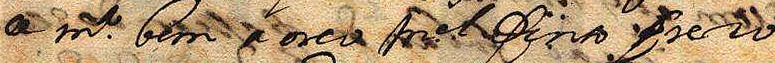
ce m.to bem ao reo M.el Pinto prezo
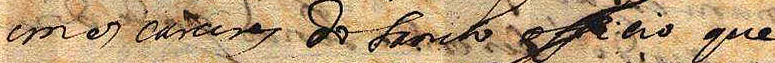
em os carceres do Sancto officio que
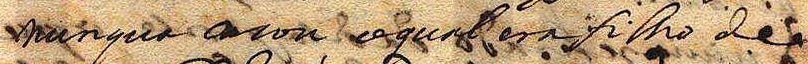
nunqua cazou, o qual era filho de
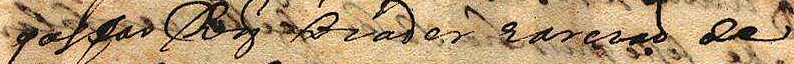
gaspar Roiz̄ tozador, E a rezaõ de
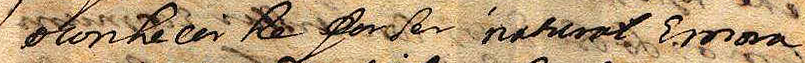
o conhecer he por ser natural E mora
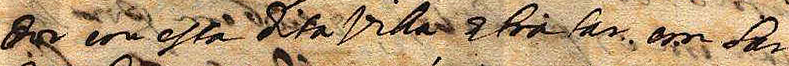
dor em esta dita Villa, E tratar em Sar
